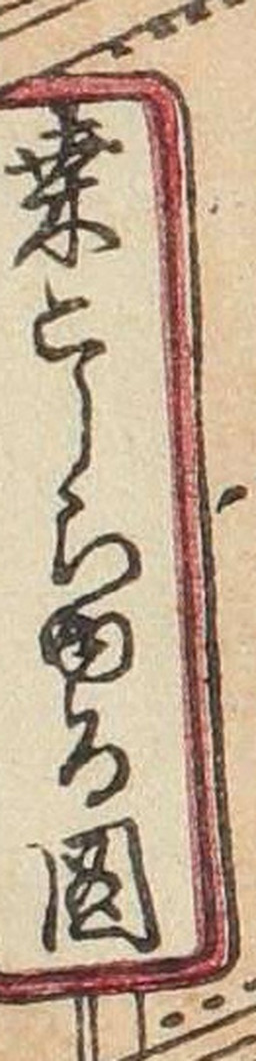桑こしらゆる図
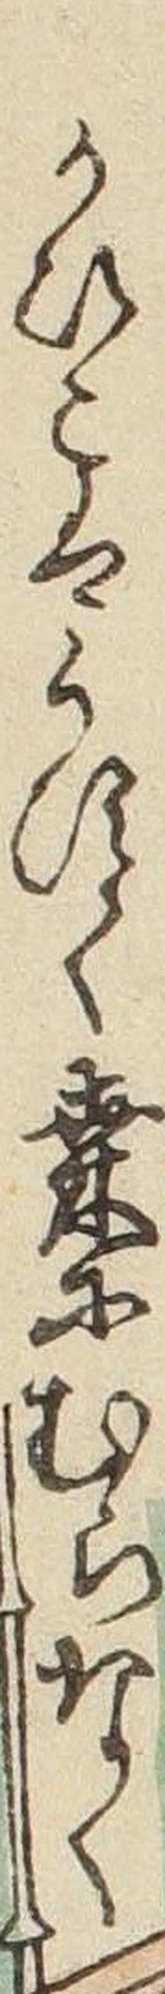かひこはうすく桑にむらなく

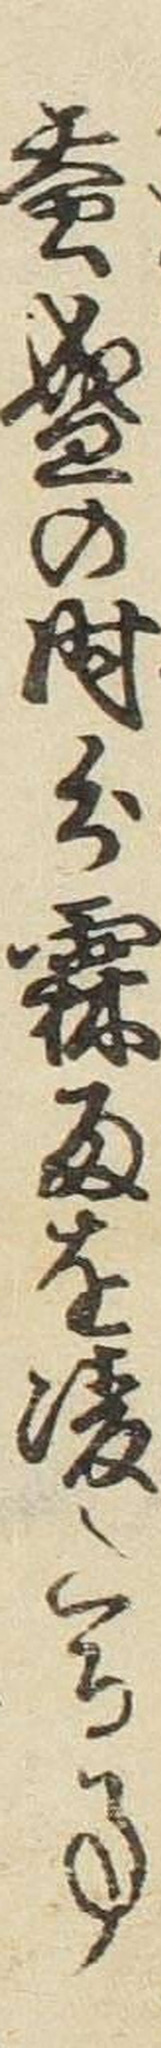蚕盛の時分霖雨を凌たる事
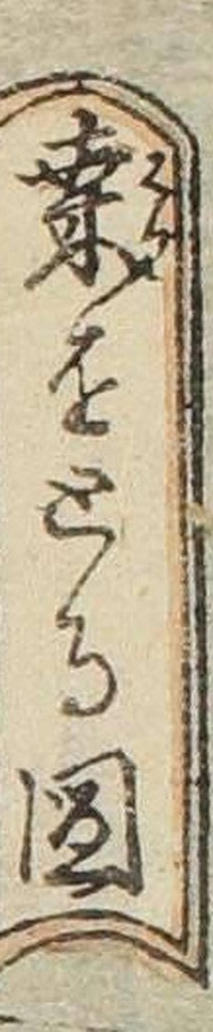桑をとる図
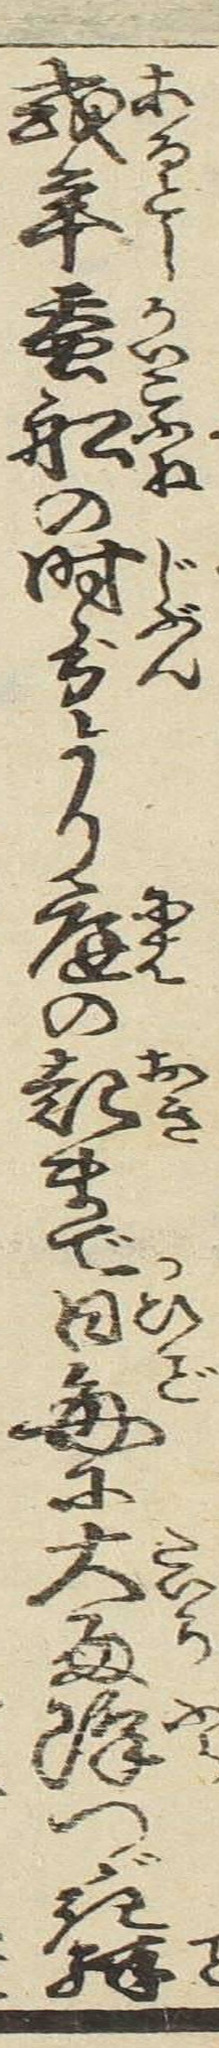或年蚕船の時分より庭の起まで。日毎に大雨降つゞき殊
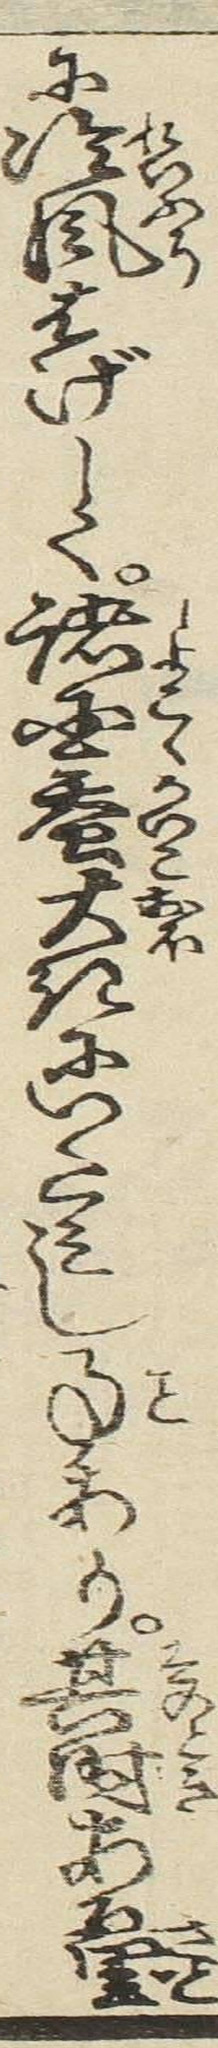に冷風はげしく。諸国蚕大きにいたみし事あり。其時ある里
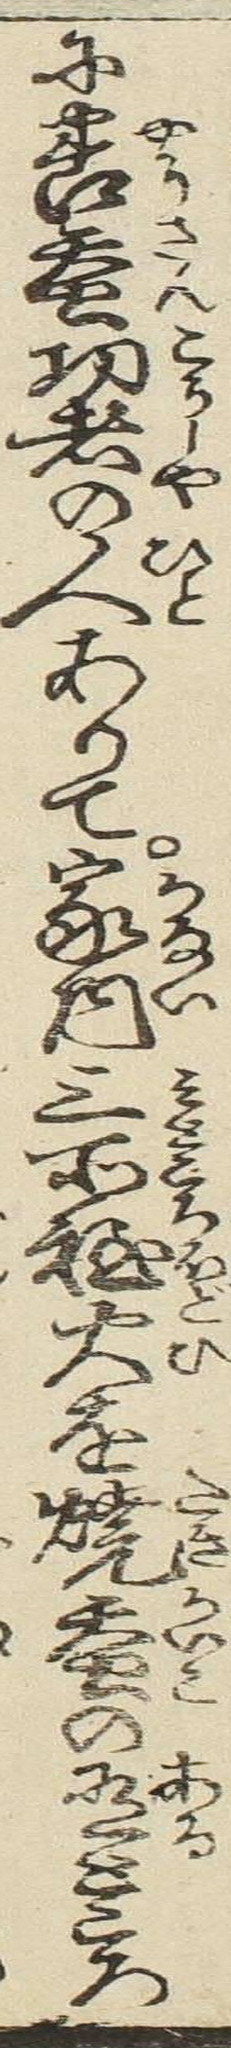に養蚕功者の人ありて。家内三所程火を焼蚕の有ところ
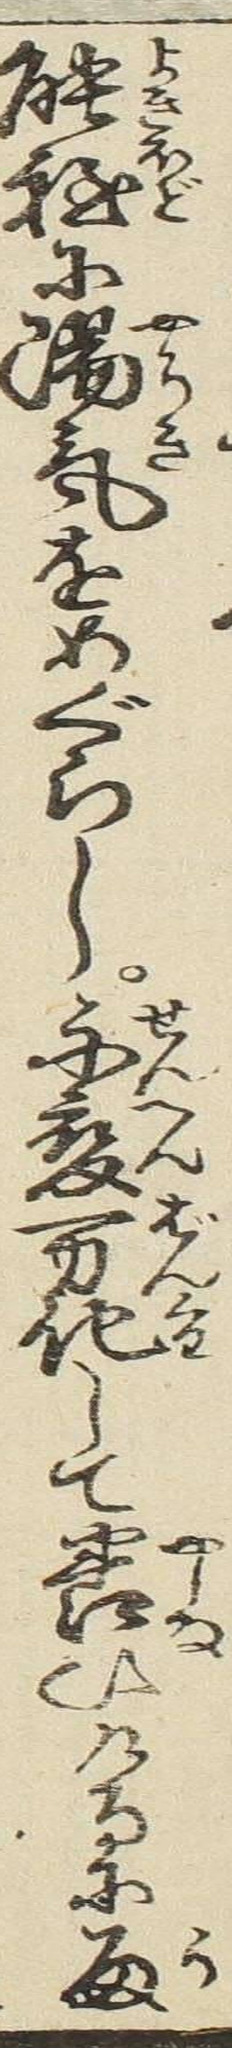能程に陽気をめぐらし。千変万化して養ひけるに雨
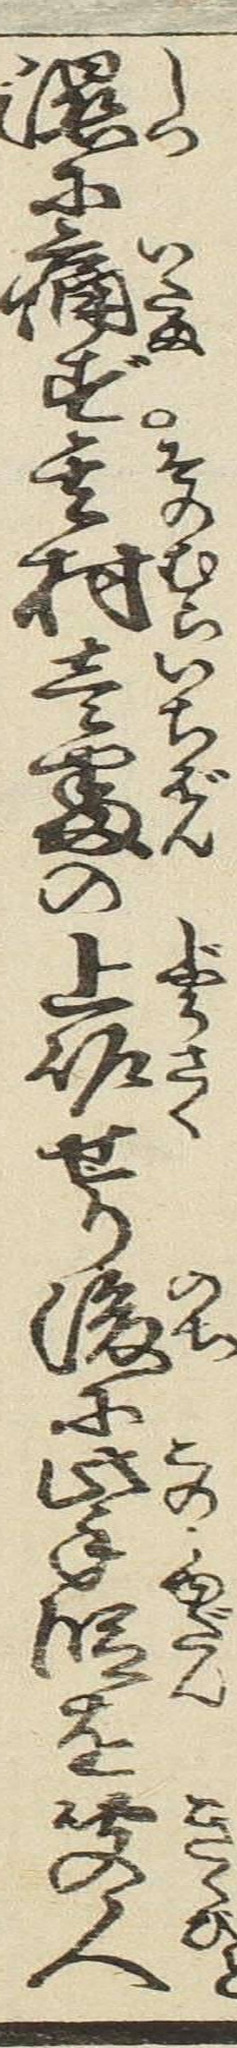湿に痛ず。其村壱番の上作せり後に此手段を聞人
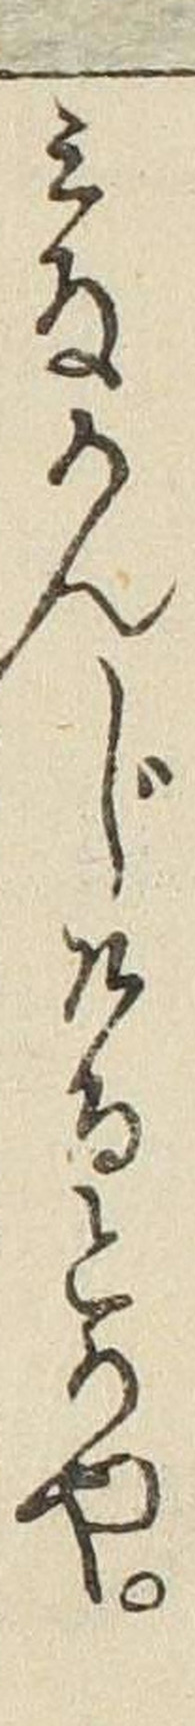みなかんじけるとかや。
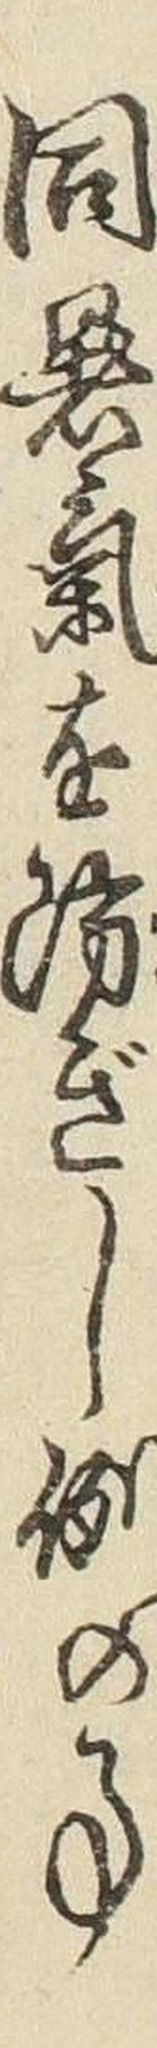同暑気を防ぎし例の事
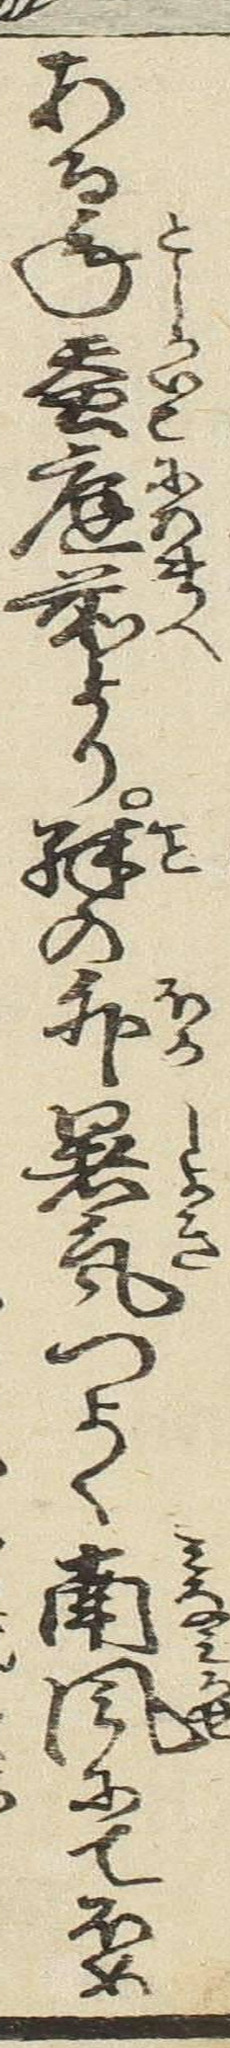ある年蚕庭前より。殊の外暑気つよく南風にてほめ
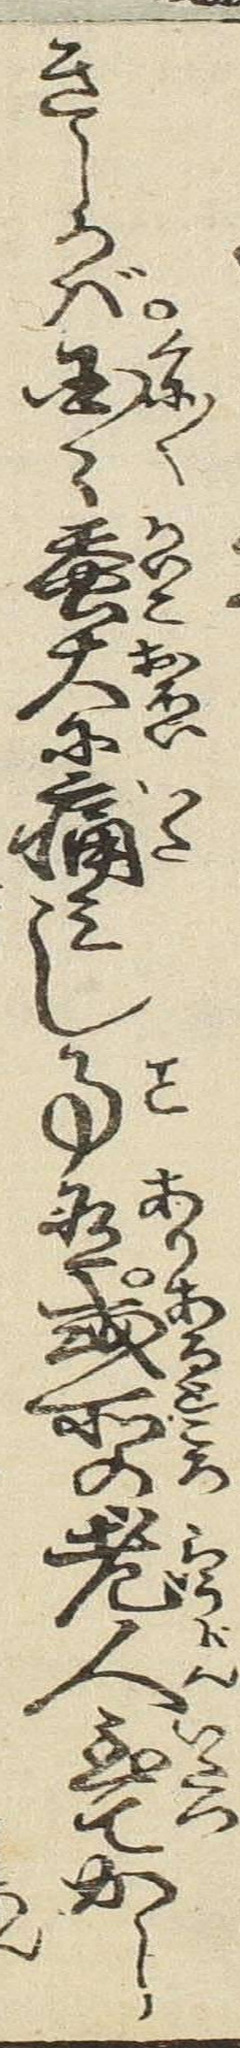きしかば。国々蚕大に痛みし事有。或所の老人至てかし
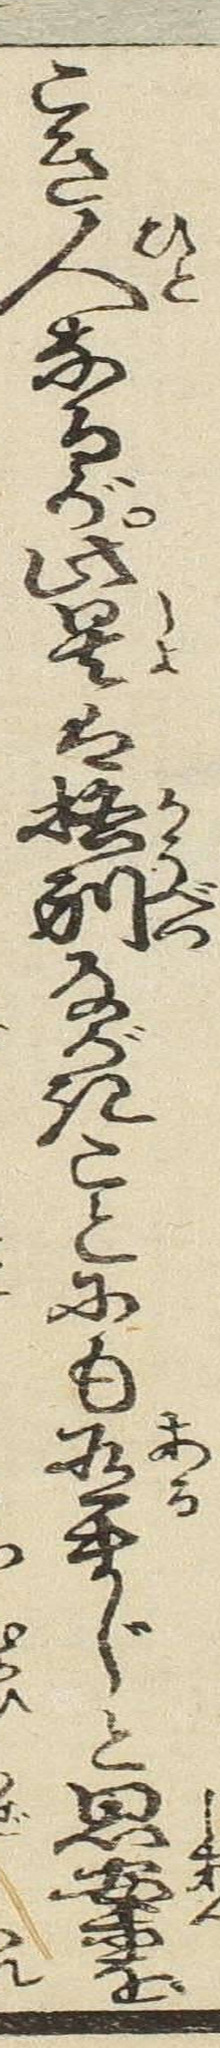こき人なるが。此暑は格別ながきことにも有まじと思案を
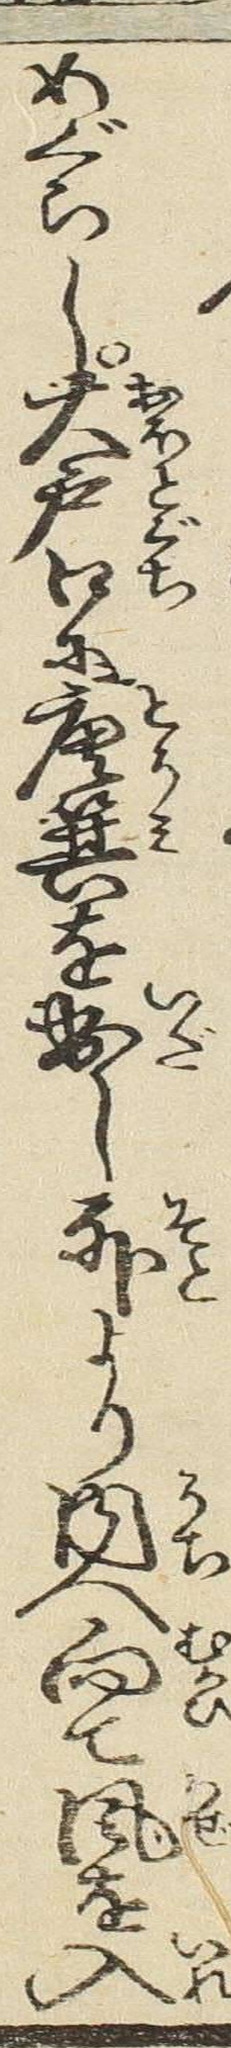めぐらし。大戸口に唐箕を出し外より内へ向て風を入
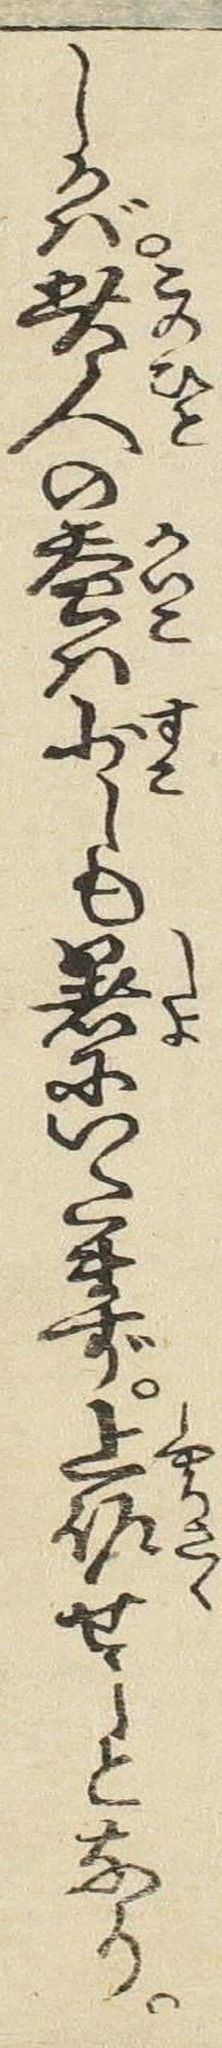しかば。此人の蚕は少しも暑にいたまず。上作せしとなり。
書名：養蠶圖解
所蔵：東京大学農学生命科学図書館 国文学研究資料館
